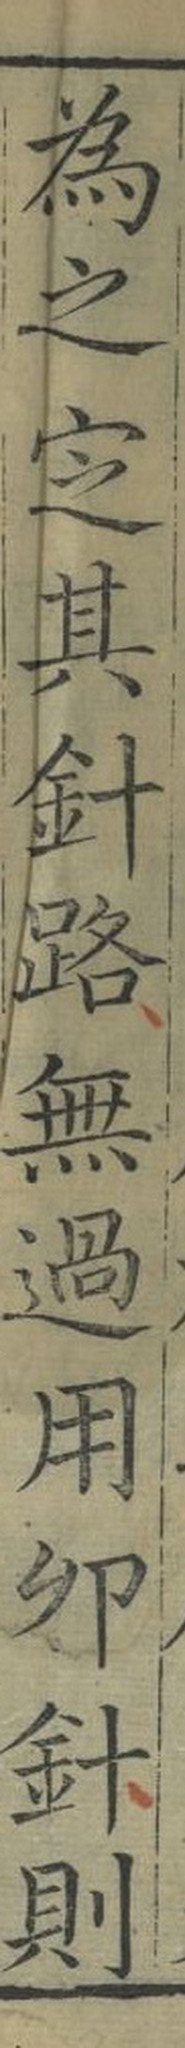為之㝎其針路無過用叩針則
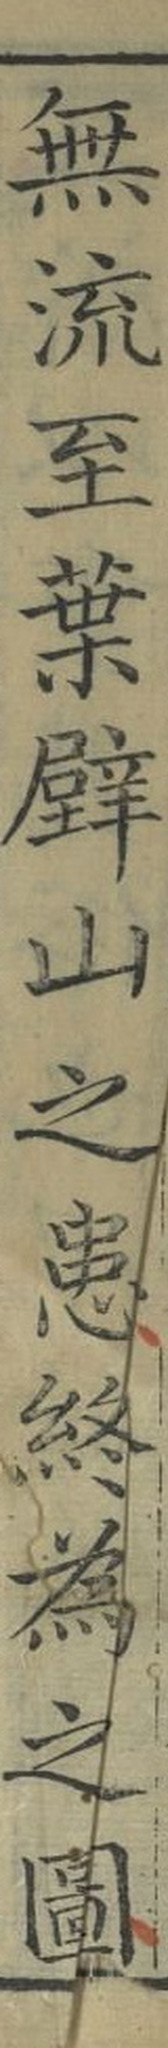無流至葉壁山之患終為之圖
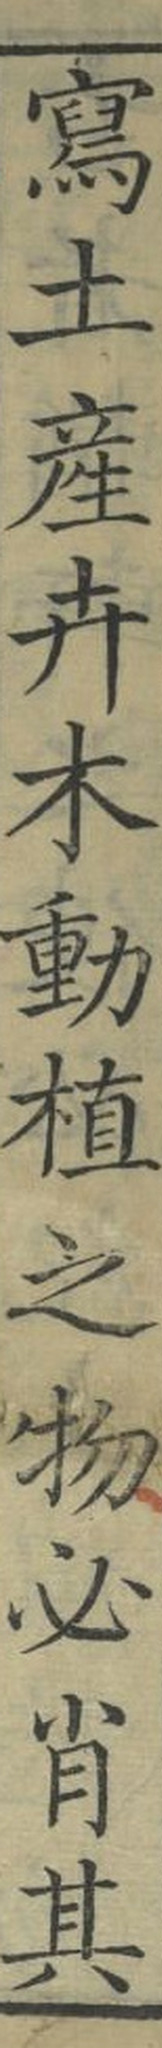寫土産卉木動植之物必肖其
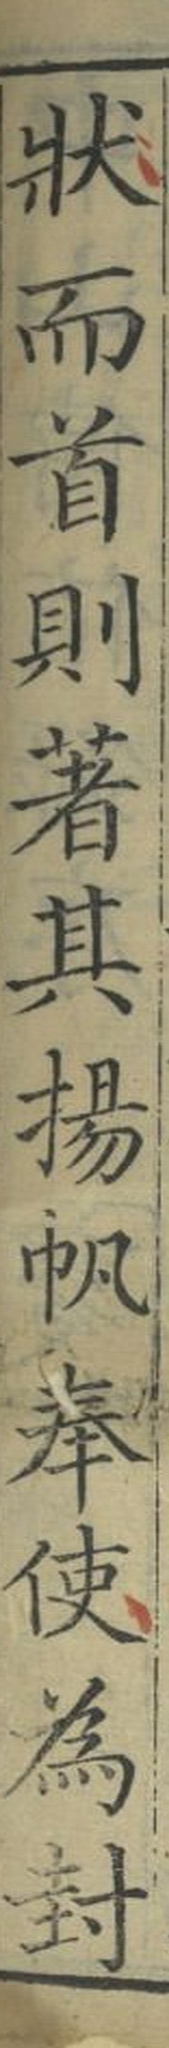狀而首則著其揚帆奉使為封
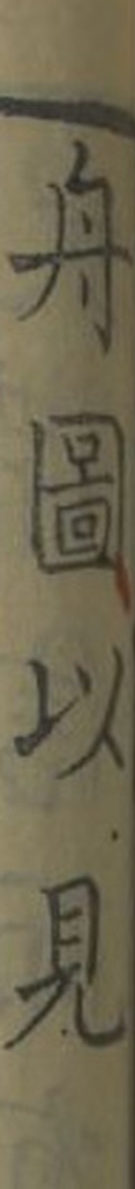舟圖以見
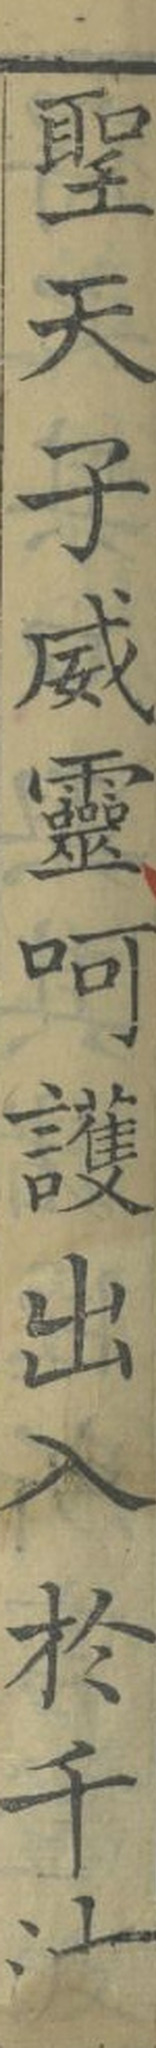聖天子威靈呵護出入扵千波
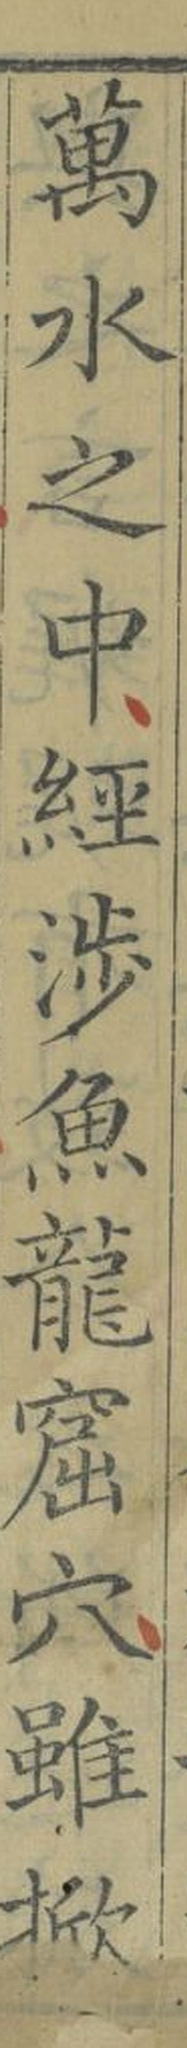萬水之中經渉魚龍窟穴雖掀
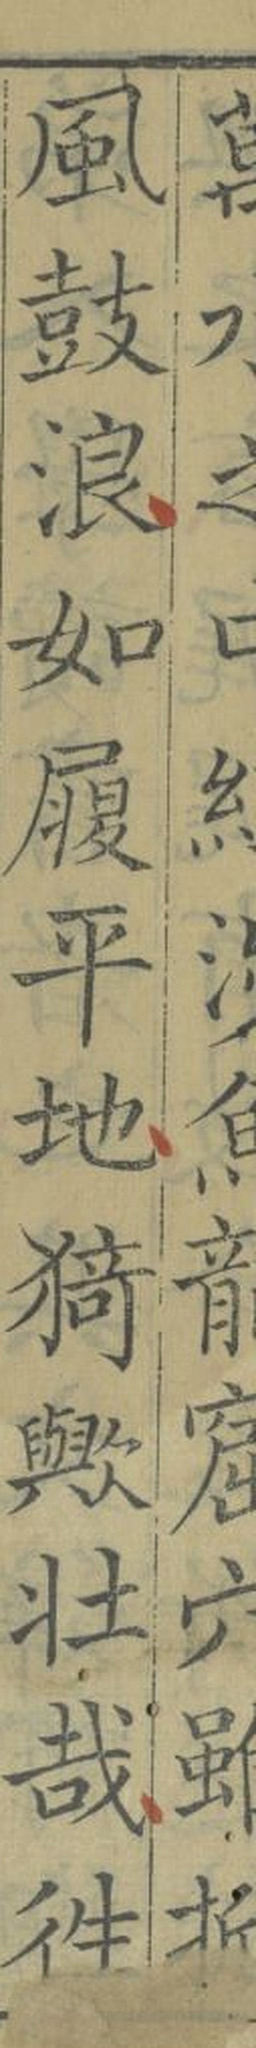風鼓浪如履平地猗歟壮哉徃
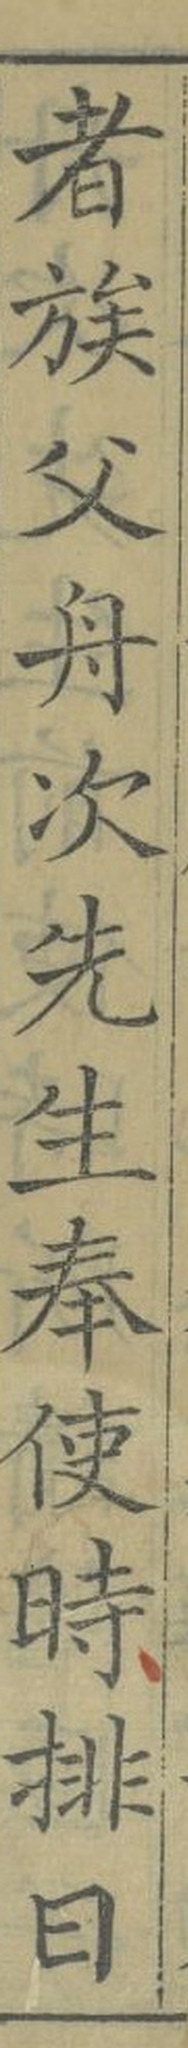者族父舟次先生奉使時排日
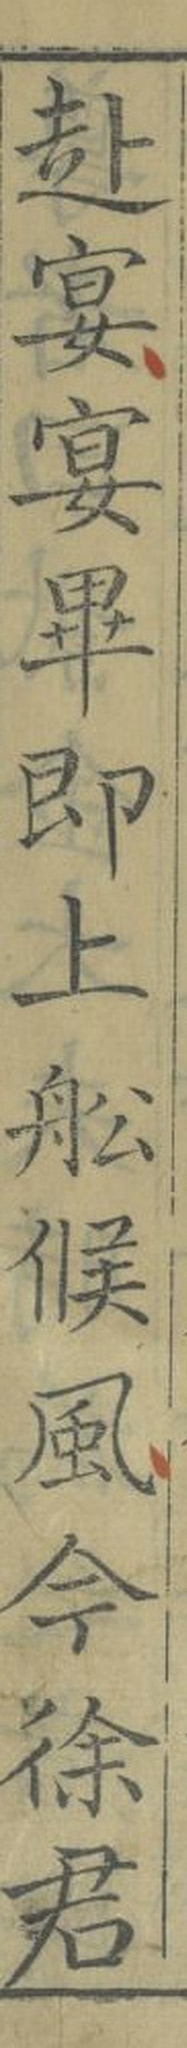赴宴宴畢即上舩候風今徐君
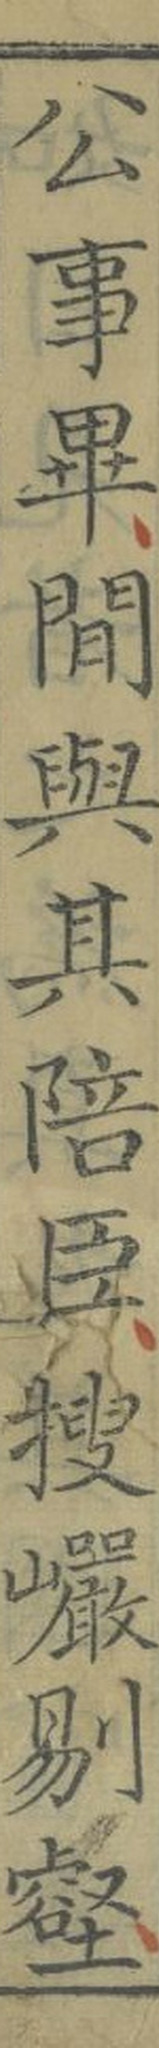公事畢閒與其陪臣搜巗剔壑
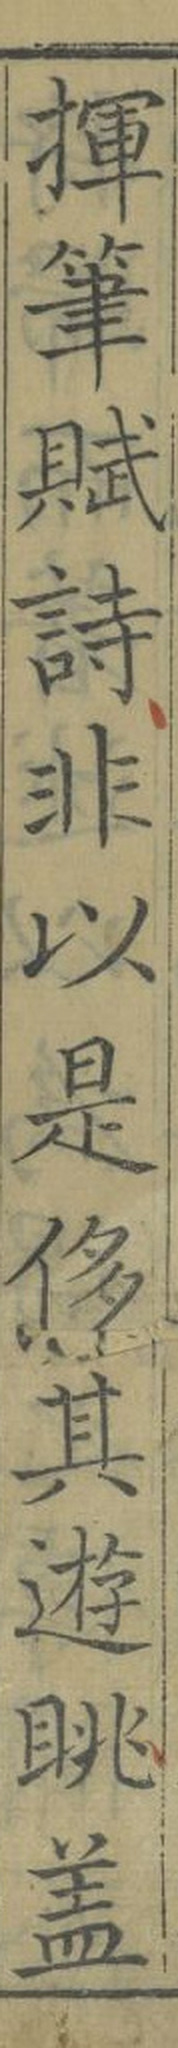揮筆賦詩非以是侈其逰眺盖

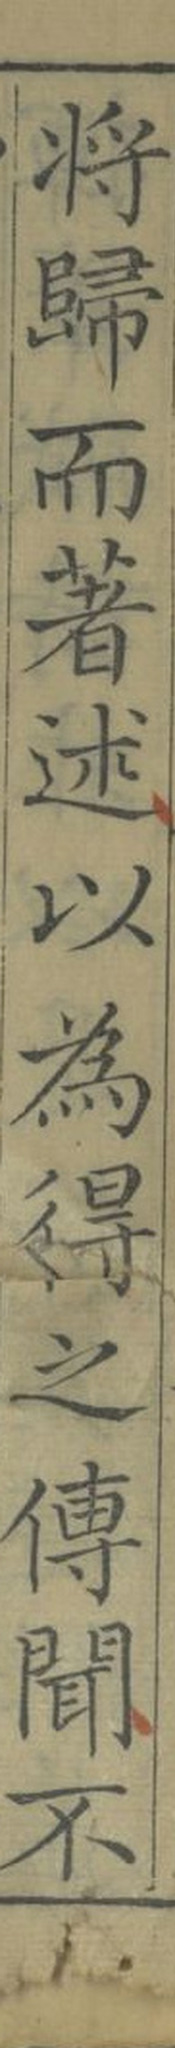将歸而著述以為得之傳聞不
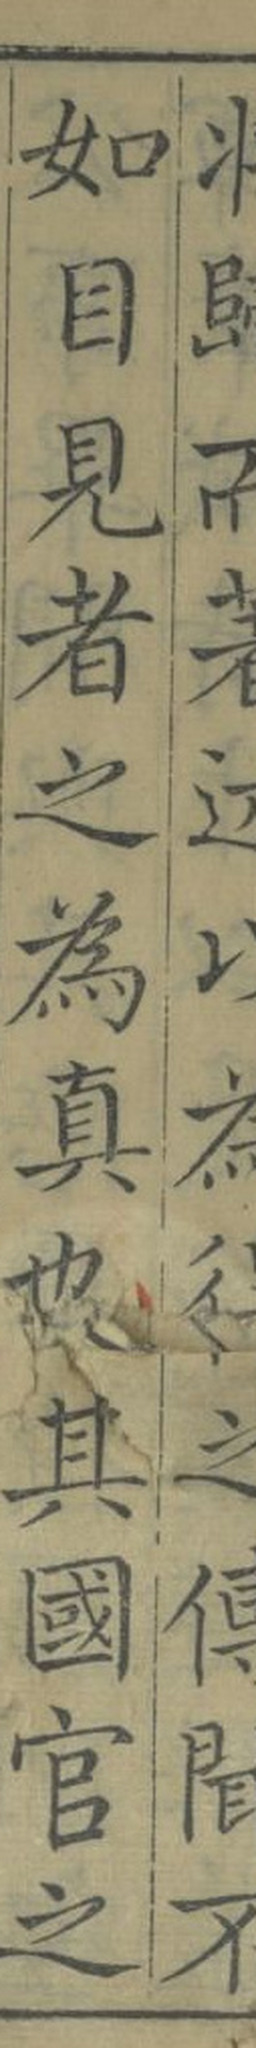如目見者之為真也其國官之
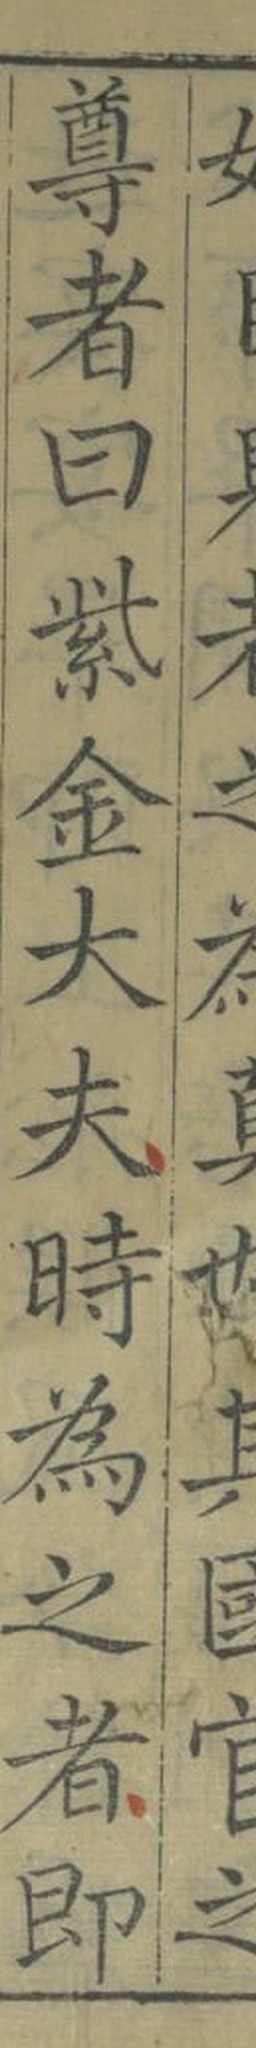尊者曰紫金大夫時為之者即
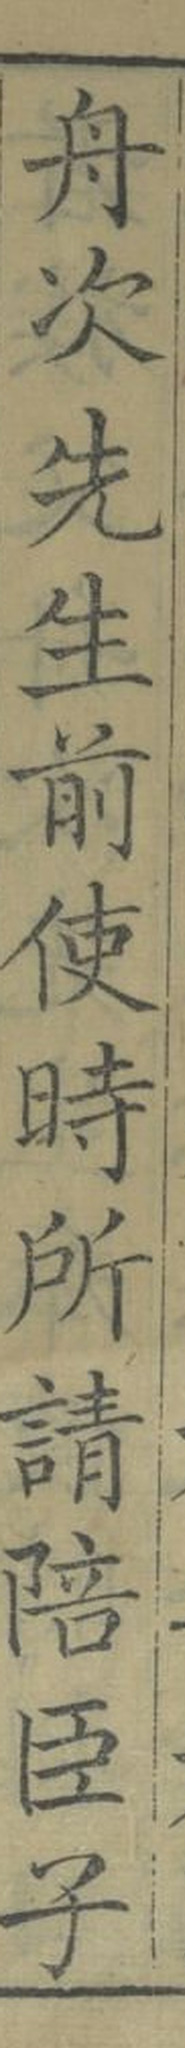舟次先生前使時所請陪臣子
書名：中山伝信録 巻一、巻二
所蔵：University of the Ryukyus Library
